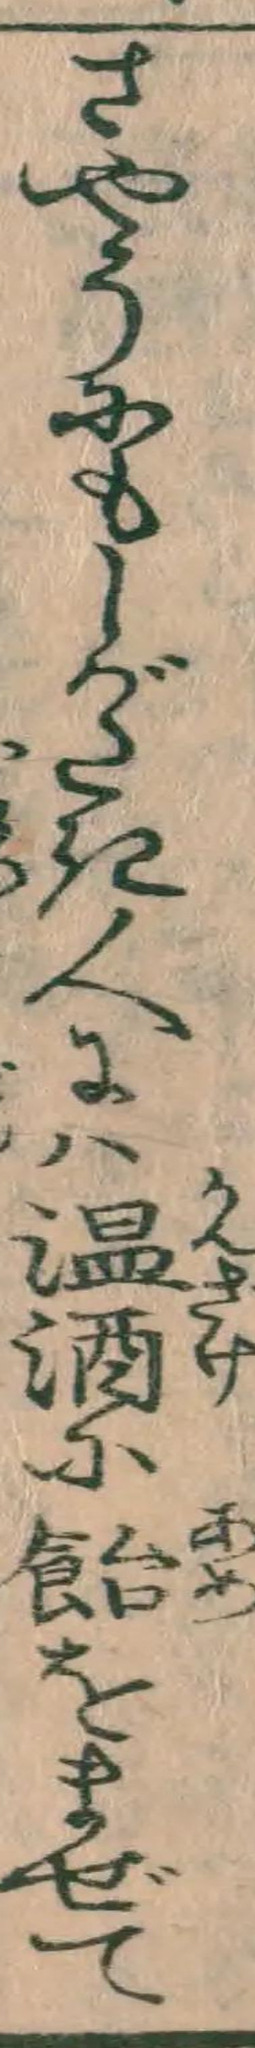さやうにもしがたき人には温酒に飴をまぜて
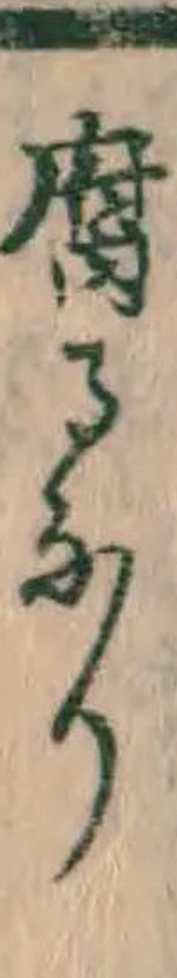腐るなり
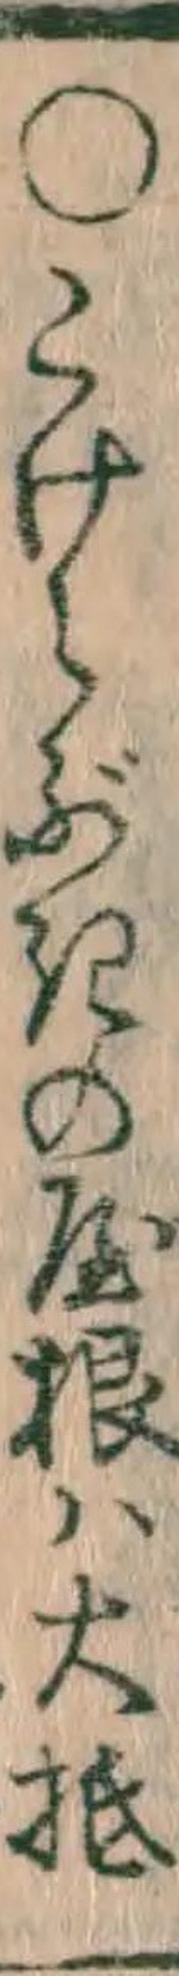○こけらぶきの屋根は大抵
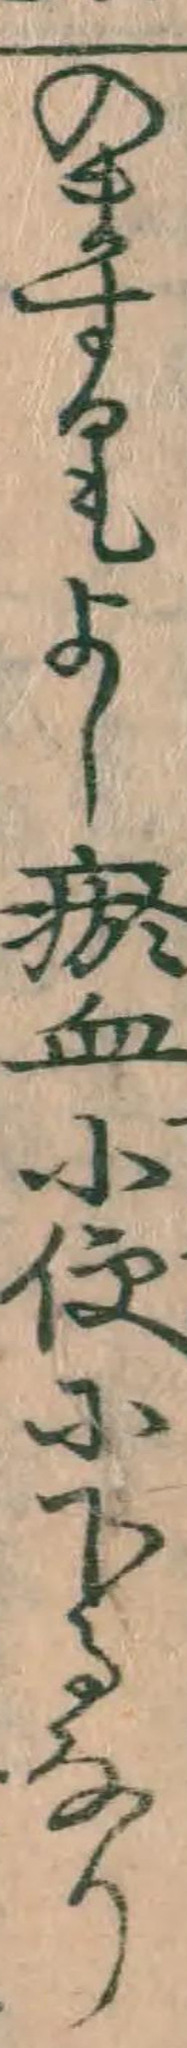のまするもよし瘀血小便に下るなり
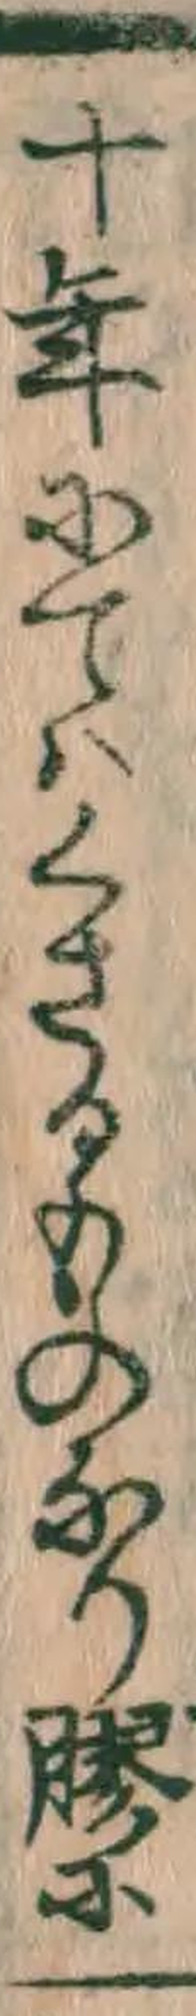十年にてはくさるものなり膠に
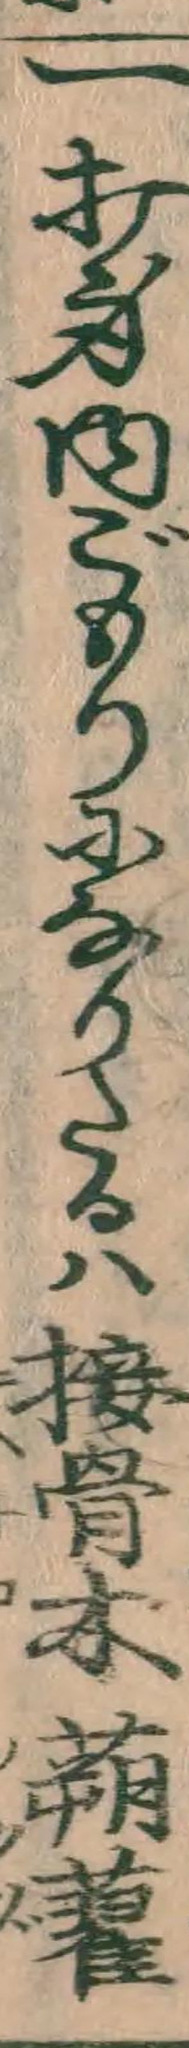一打身肉ごもりになりたるは接骨木蒴藋
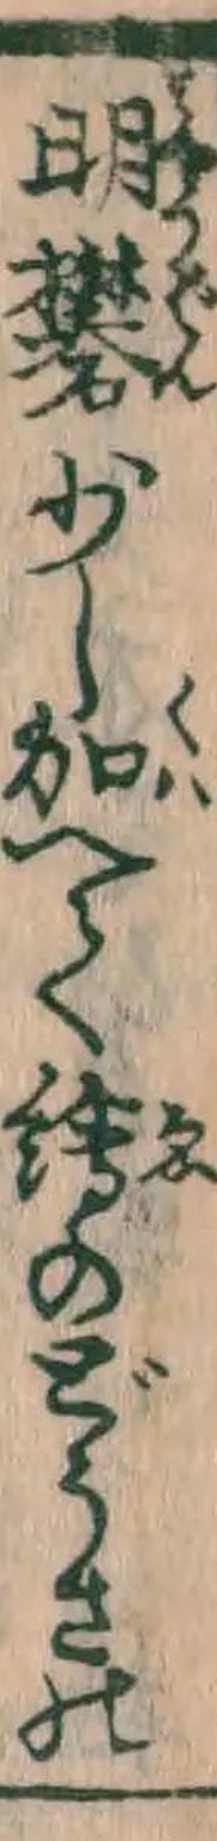明礬少し加へて絵のどうさの
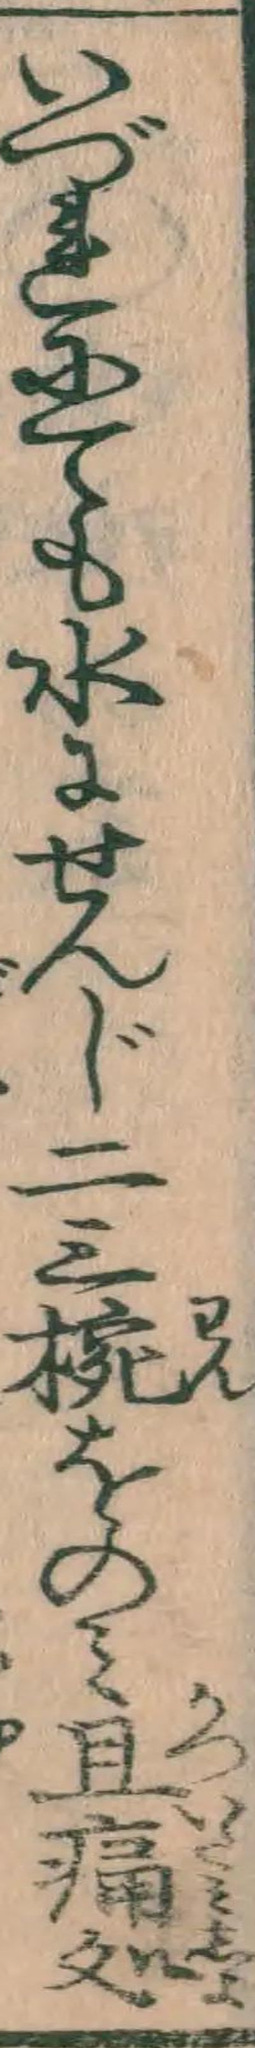いづれにても水にせんじ二三椀をのみ且痛処
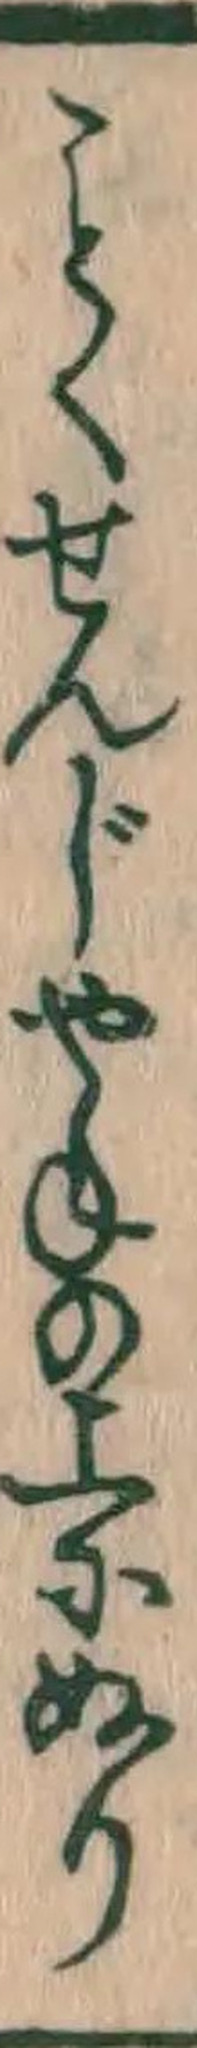ことくせんじやねの上にぬり
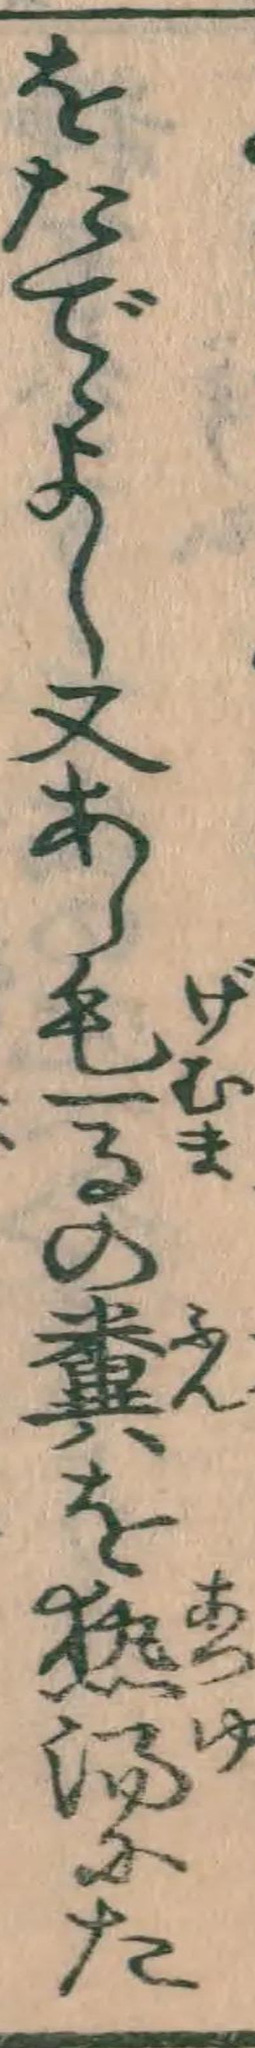をたでゝよし又あし毛馬の糞を熱湯にた
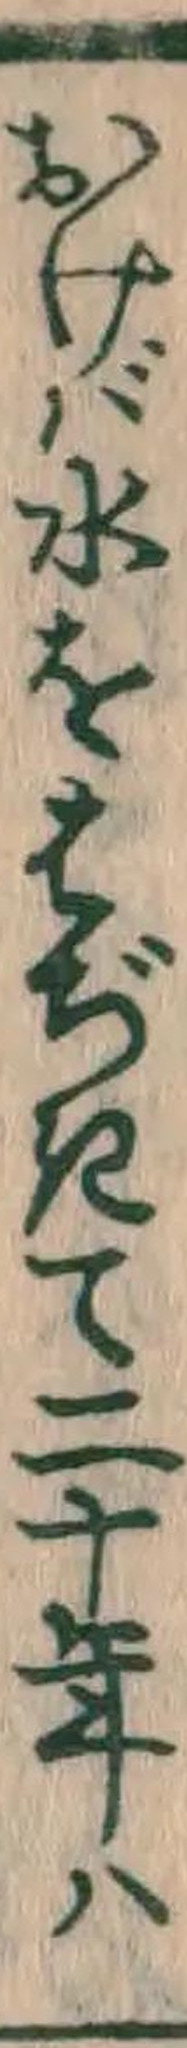おけば水をはぢきて二十年は
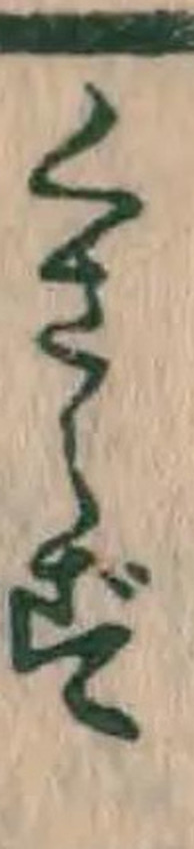くさらず
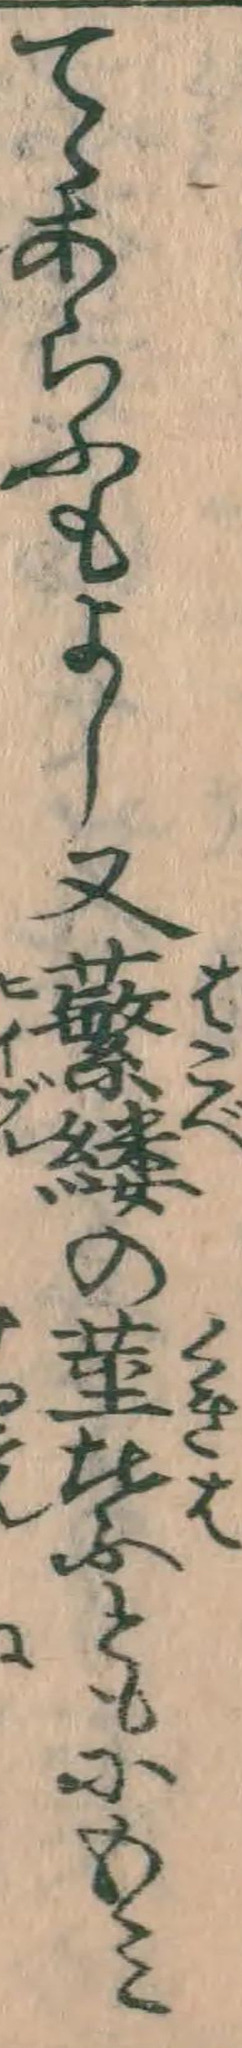てゝあらふもよし又蘩縷の茎葉ともにもみ
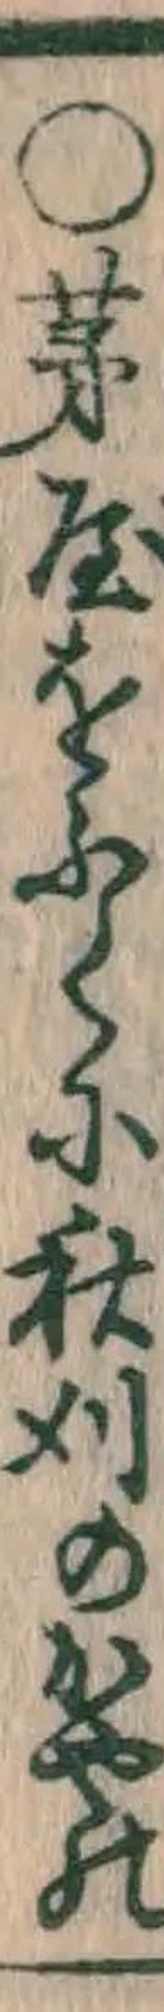○茅屋をふくに秋刈のかやの
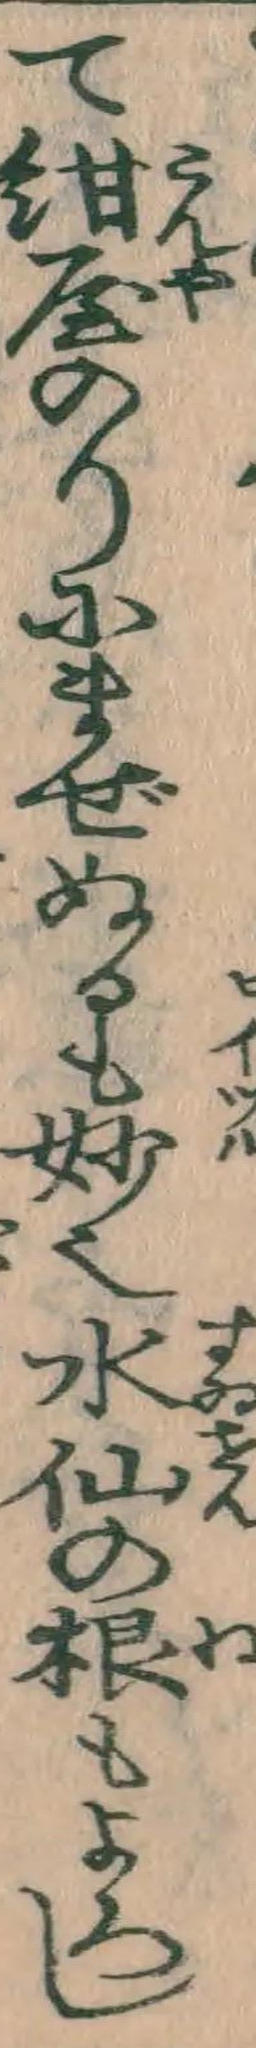て紺屋のりにまぜぬるも妙也水仙の根もよろし
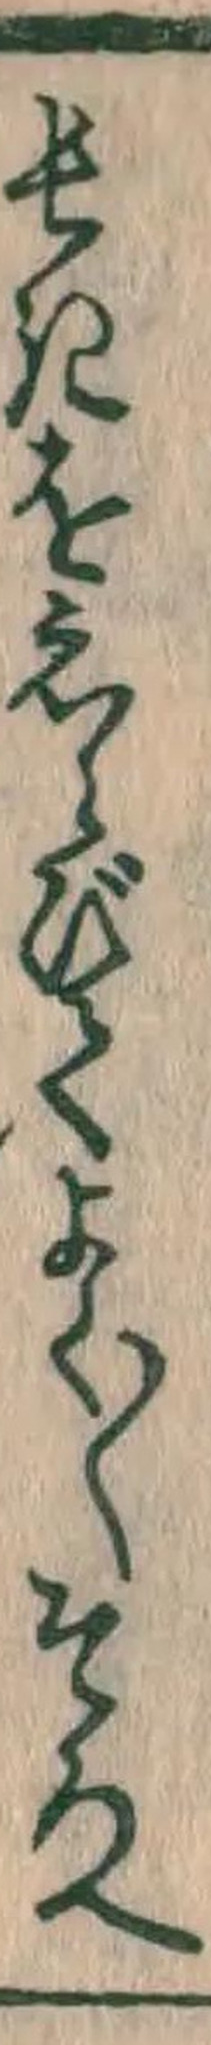長きをえらびてよく〳〵そろへ
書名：広益秘事大全 3巻. [3]
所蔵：国立国会図書館 National Diet Library, JAPAN
